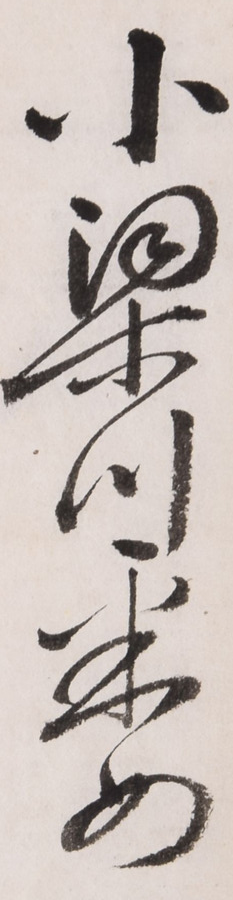小梁川采女
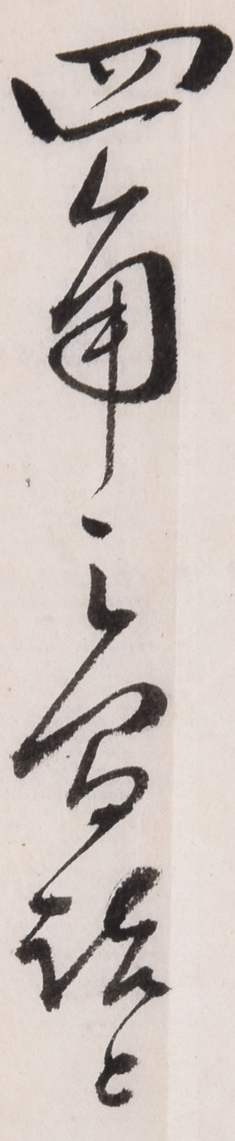四角之間詰被
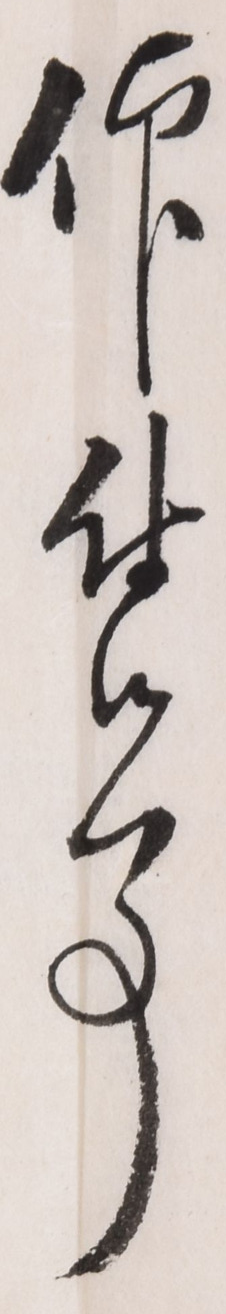仰付候事
